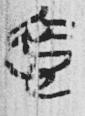○（哀）
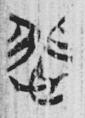悲
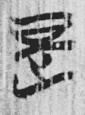是
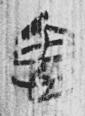思
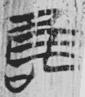唯
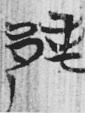邦
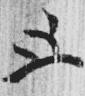之
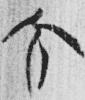大
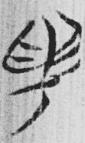○（務）
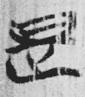是
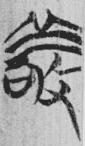敬
